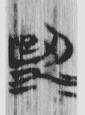渴
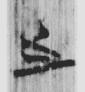之
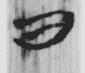日
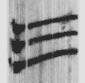三
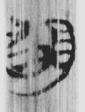旬
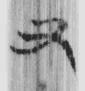又
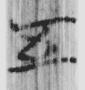五
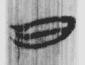日
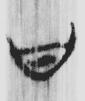甘
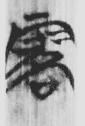{雨各}
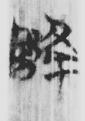降
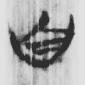自
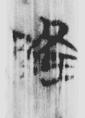降
